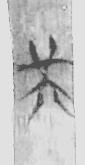{廿六}
